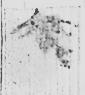六十=
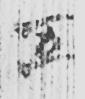五
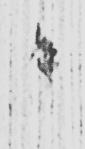千
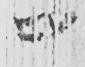四
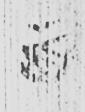百
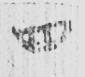四
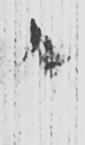千
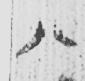八
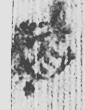百
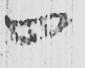四
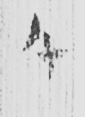千
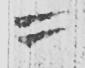二
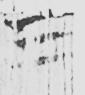三
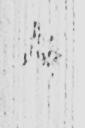千
